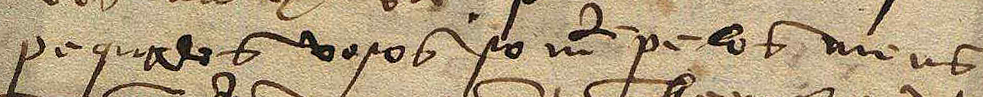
pequados vosos somte pelos meus
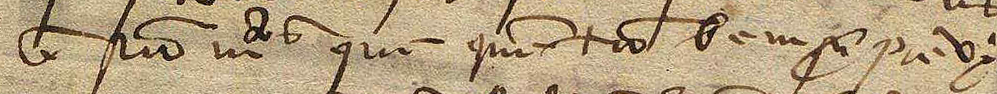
q̄ sā mtos que quē tābem sēpre vy
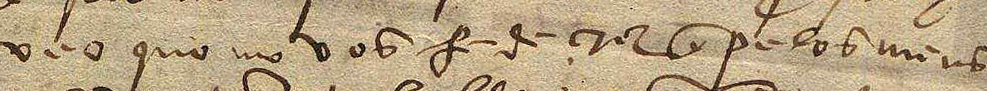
veo quomo vos he de crer q̄ pelos meus
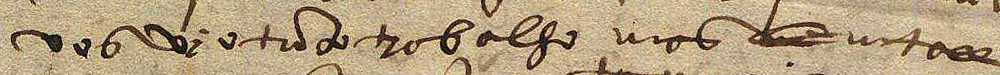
vos vio tāto trabalho mas em tall
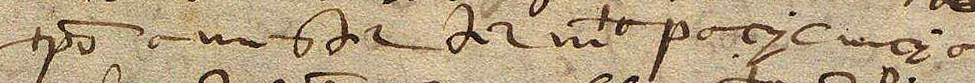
tpō a mester ter mta pacyemcya
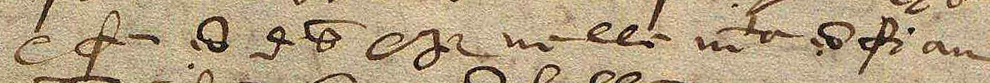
e fe ē des̄ e ter nelle mta cōfian
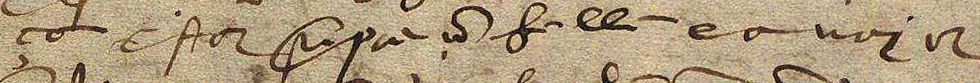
ça e star sēpre cō helle e a mayor
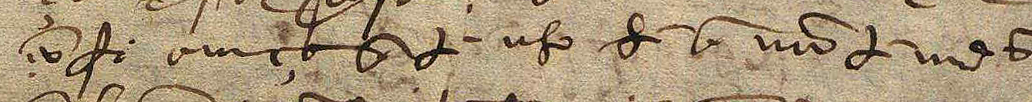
cōfiamça q̄ tenho he q̄ nā temdes
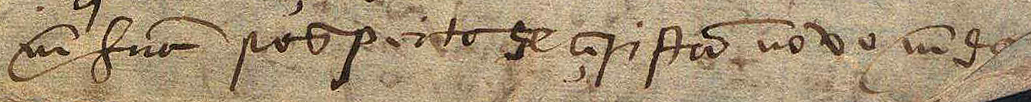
nēhuā sospeita de cristão novo nē da
